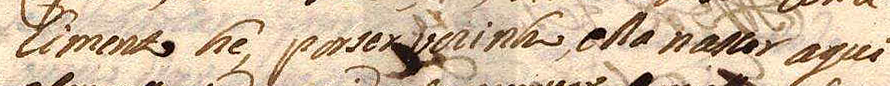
Cimento he, por ser vezinho, ella nascer aqui
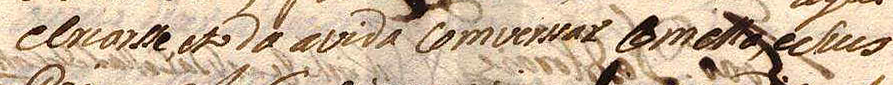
e crearsse, e toda a vida comverssar com ella, e seus
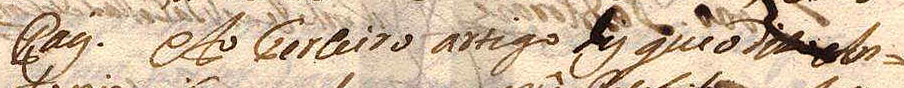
Paes. Ao Terceiro artigo dis que o dito An
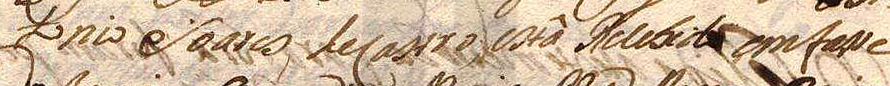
tonio Soares de Castro está Recebido em fasse
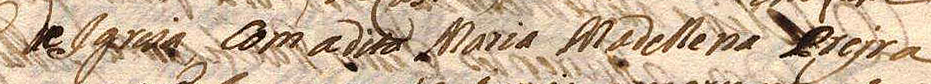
de Igreia, com a dita Maria Madellena Prejra
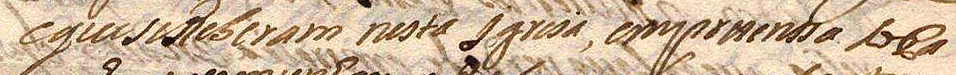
e que se Reberam nesta Igreia, em promessa do Pa
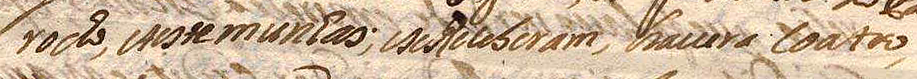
roco, e testemunhas; e se Receberam, hauera coatro,
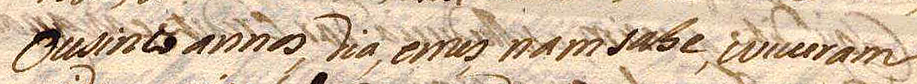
ou sinco annos, dia, e mes nam sabe, e viueram
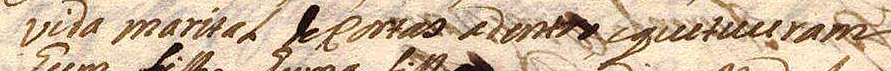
vida marital de portas adentro, e que tiueram
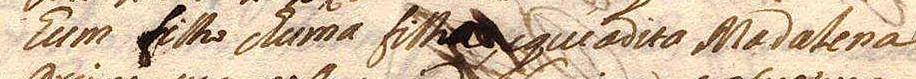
hum filho e huma filha, e que a dita Madalena
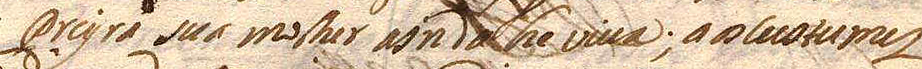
preyra sua molher ainda he viua; aos custumes
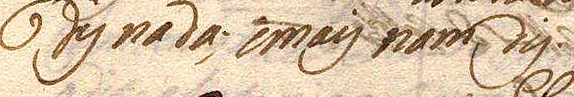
dis nada; e mais nam dis.
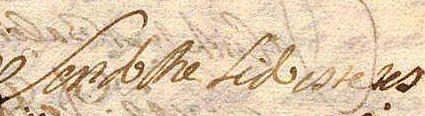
Sendolhe lido este tes
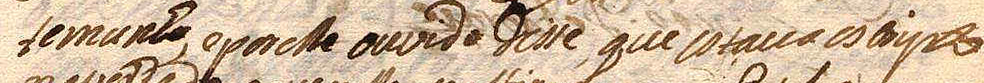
temunho, e por elle ouvido disse, que estaua escripto
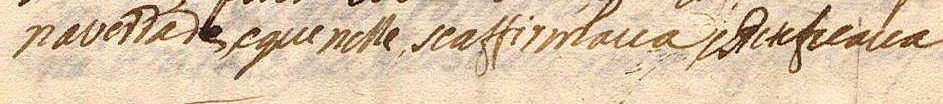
na verdade, e que nelle se affirmaua, e Reteficaua
